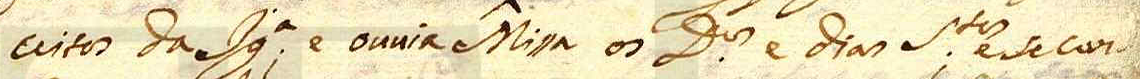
ceitos da Iga; e ouuia Missa os D.os e dias S.tos, e se con
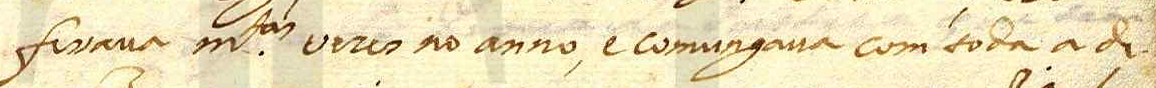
fessaua m.tas vezes no anno, e comungaua com toda a de
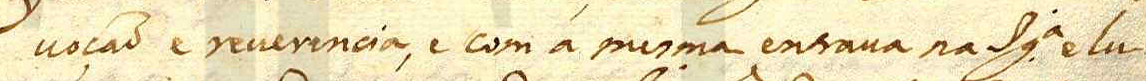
uoçaõ e reuerencia, e com a mesma entraua na Ig.a e lu
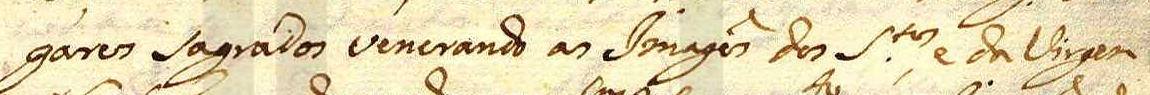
gares sagrados venerando as Imagēs dos S.tos, e da Virgem
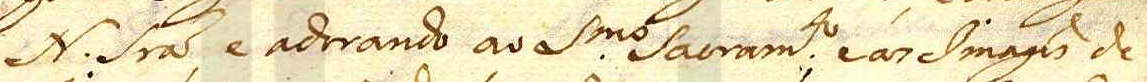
N. Srā e adorando ao S.mo Sacramto; e as Imagēs de
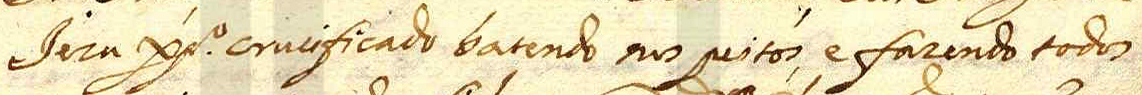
Iezu Xp.o crucificado batendo nos peitos, e fazendo todos
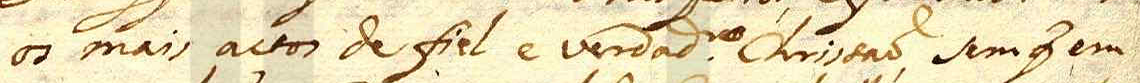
os mais actos de fiel, e verdad.ro Christaõ, sem q̄ em
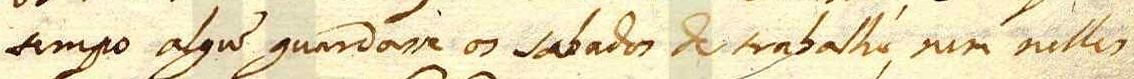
tempo algū guardasse os sabados de trabalho, nem nelles
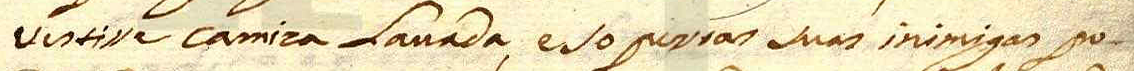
vestisse camiza Lauada, e so pessoas suas inimigas po
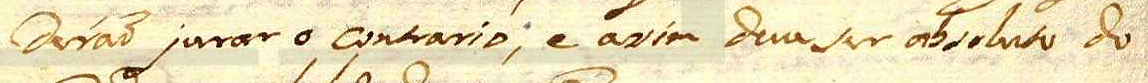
deraõ jurar o contrario; e assim deue ser absoluto do
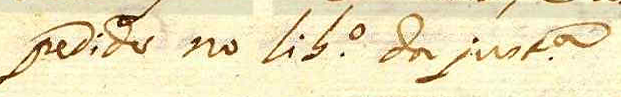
pedido no lib.o da just.a
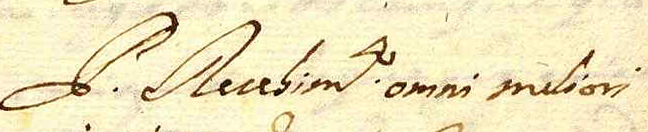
P. Recebim.to omni meliori
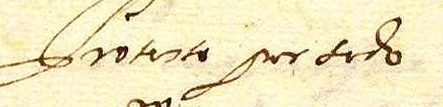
Protesto por todo
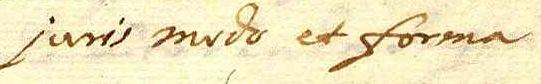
juris modo et forma
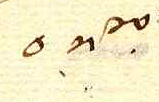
o nro.
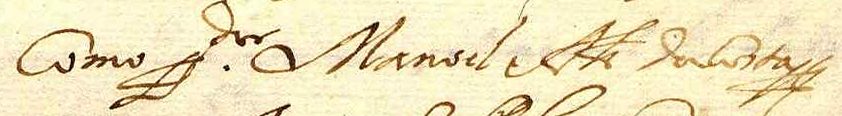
Como ꝓ.or Manoel Alz̄ da Costa
